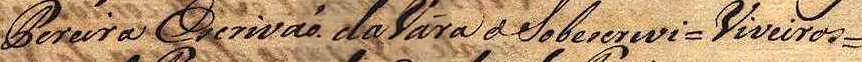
Pereira Escrivão da Vara o Sobescrevi = Viveiros
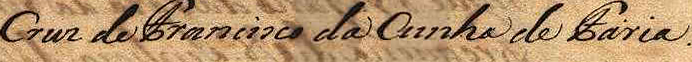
Cruz de Francisco da Cunha de Faria.
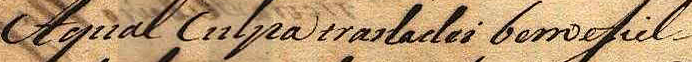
A qual culpa trasladei bem fiel
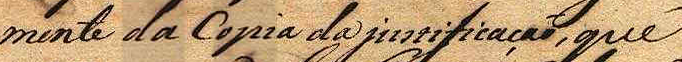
mente da Copia da justificação, que
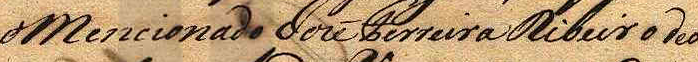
o Mencionado Iozé Ferreira Ribeiro deo
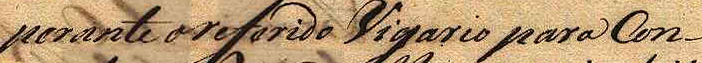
perante o referido Vigario para Con
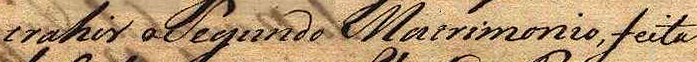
trahir o Segundo Matrimonio, feita
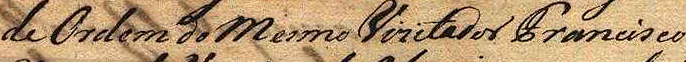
de Ordem do Mesmo Vizitador Francisco
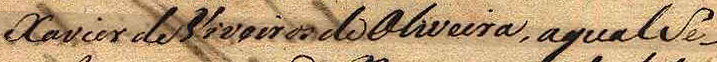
Xavier de Viveiros de Oliveira, a qual Se
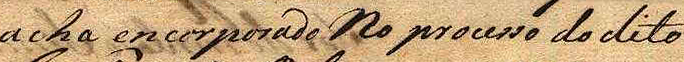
acha encorporado No processo do dito
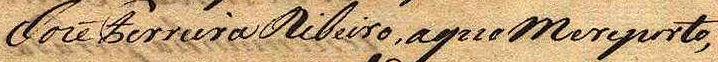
Iozé Ferreira Ribeiro, a que Me reporto,
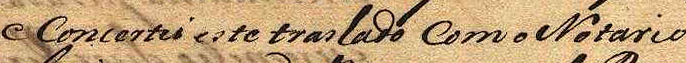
e Concertei este traslado Com o Notario
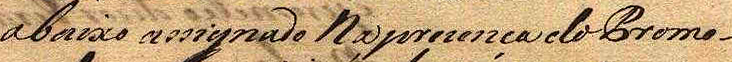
abaixo assignado Na prezença do Promo
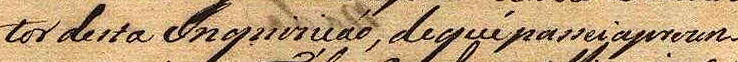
tor desta Inquizição, de que passei aprezen
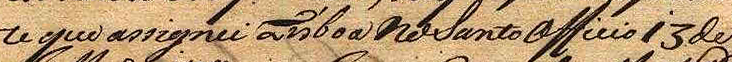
te que assignei Lisboa No Santo officio 13 de
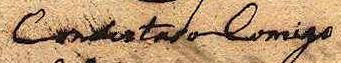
Contestado Comigo
